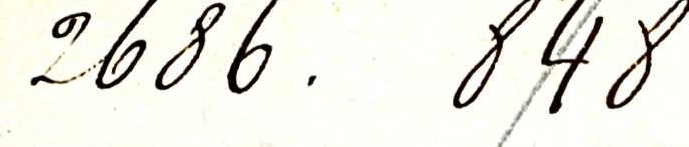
2686 [1]848
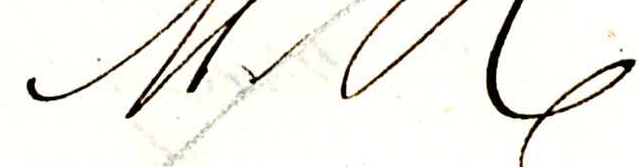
MR
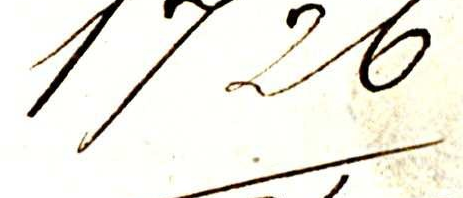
1726
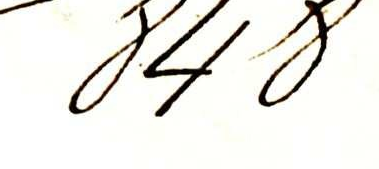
/848
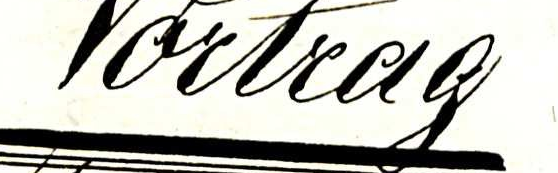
Vortrag
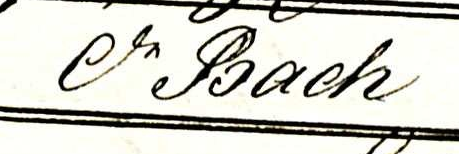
Dr Bach
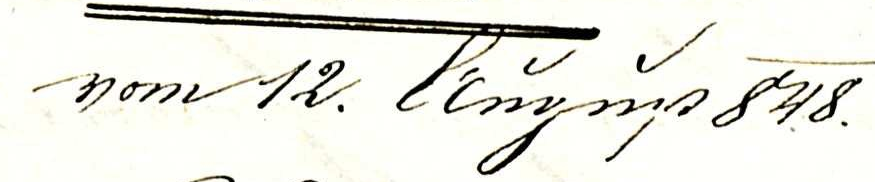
vom 12. August [1]848
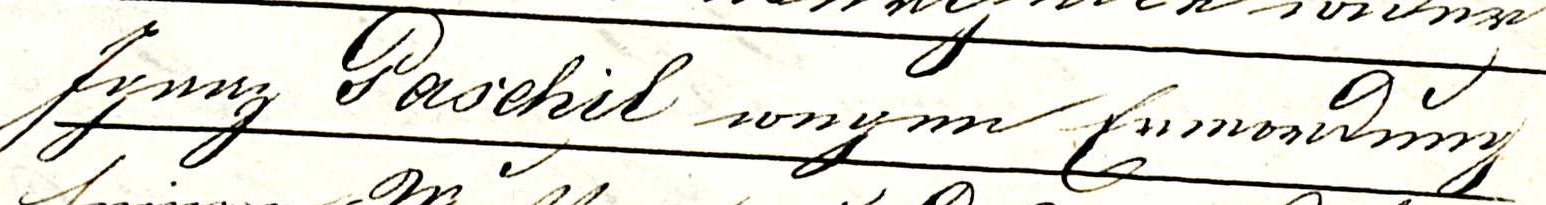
Ignaz Paschil wegen Ermordung
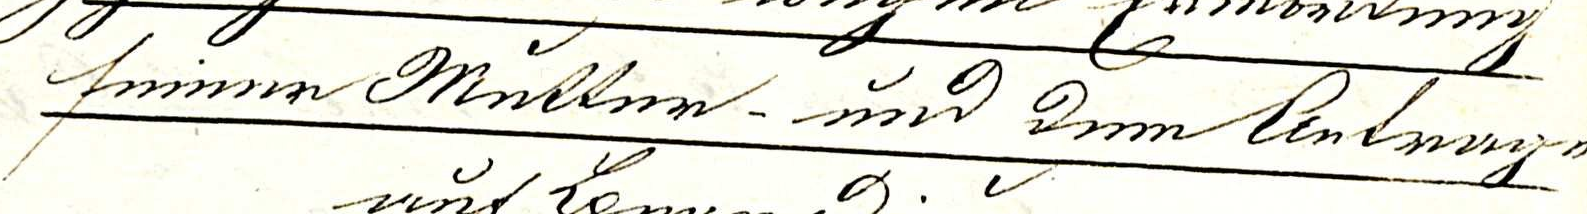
seiner Mutter und dem Antrage
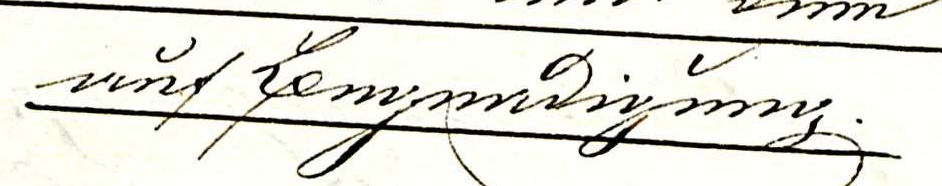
auf Begnadigung
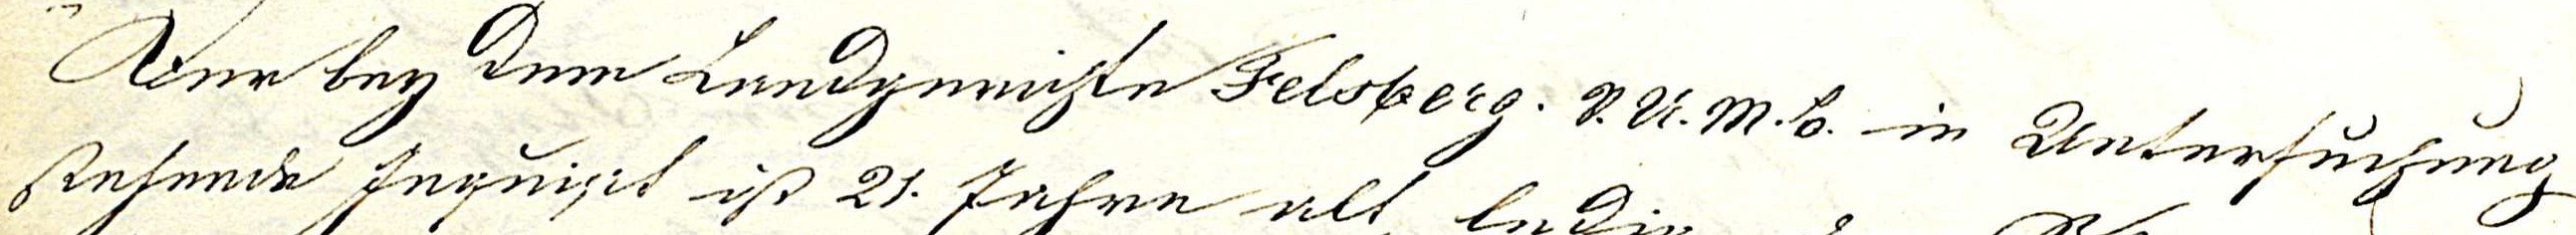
Der bey dem Landgerichte Felsberg V. U. M. B. in Untersuchung
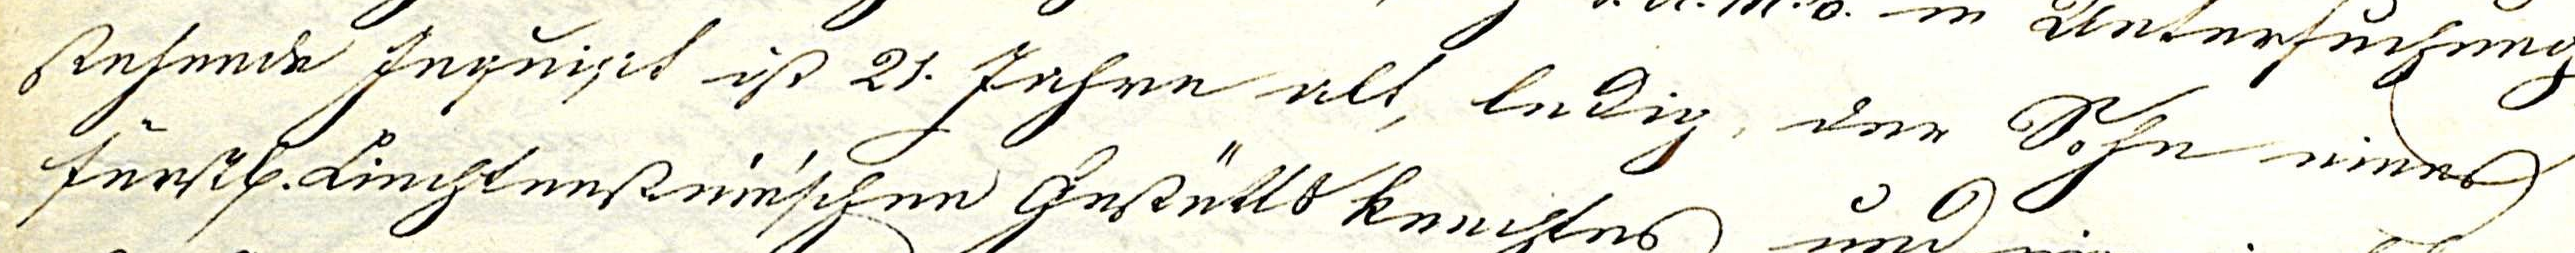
stehende Inquisit ist 21. Jahre alt, ledig, der Sohn eines
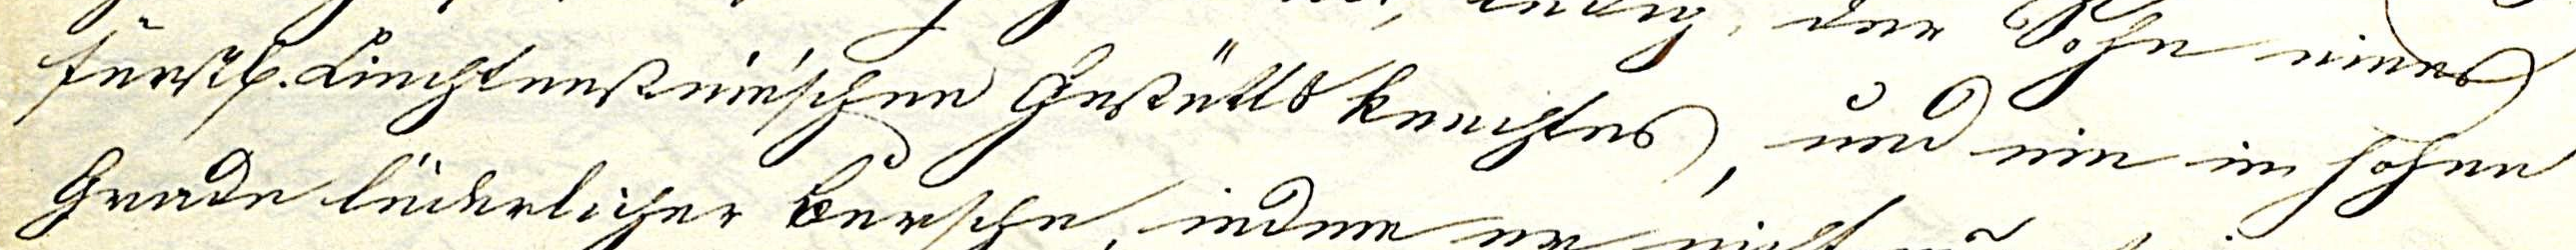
fürstl. Liechtenstein’schen Gestüttsknechtes, und ein im hohen
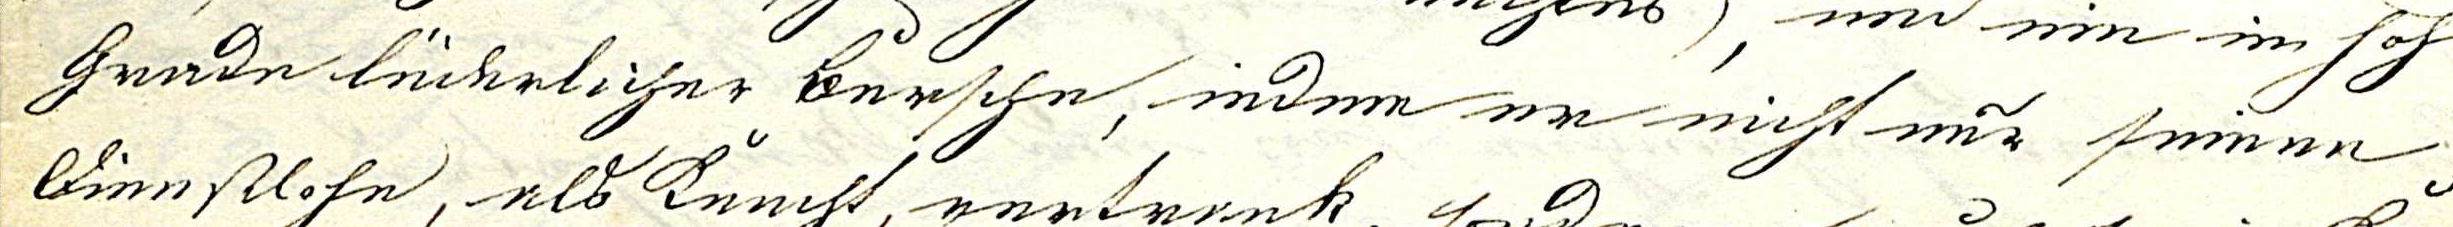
Grade lüderlicher Bursche, indem er nicht nur seinen
